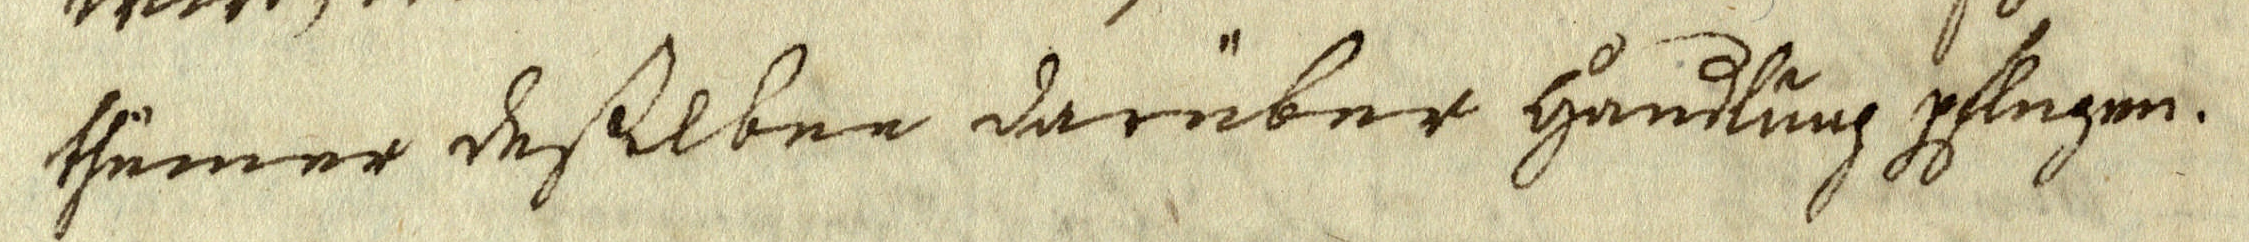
thümer deßelben darüber Handlung pflegen.
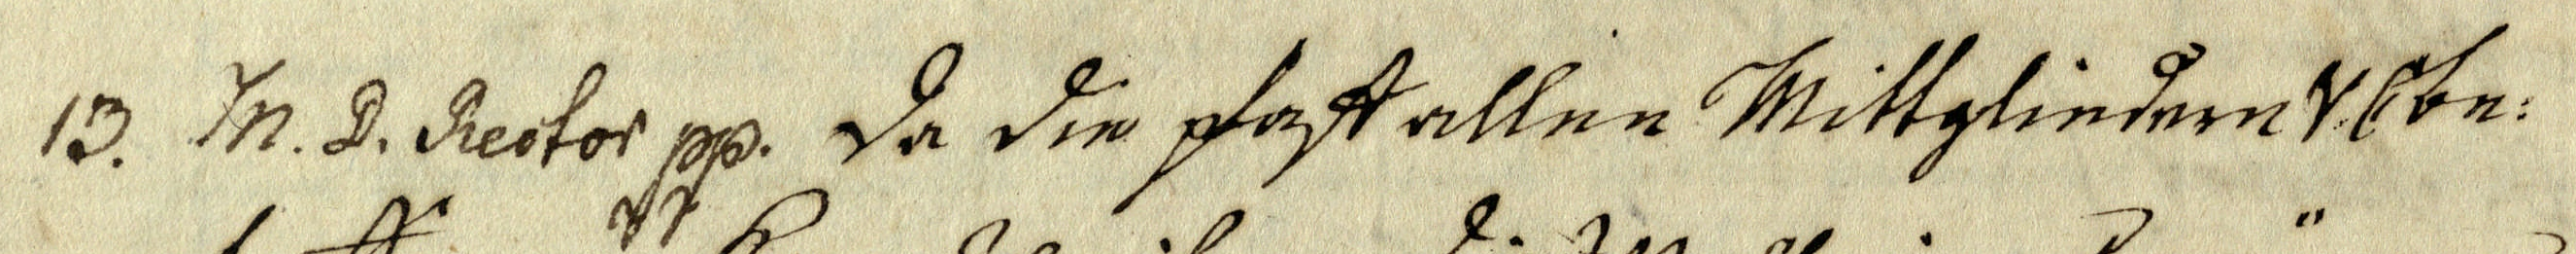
13. M. D. Rector pp. Da die fast allen Mittgliedern V. C be¬
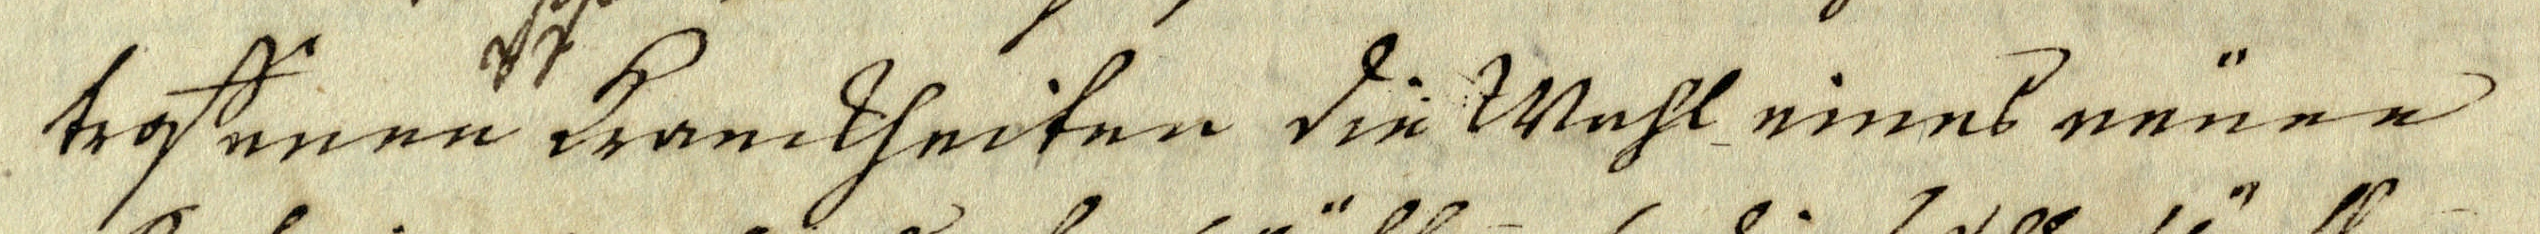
troffenen Kranckheiten die Wahl eines neuen
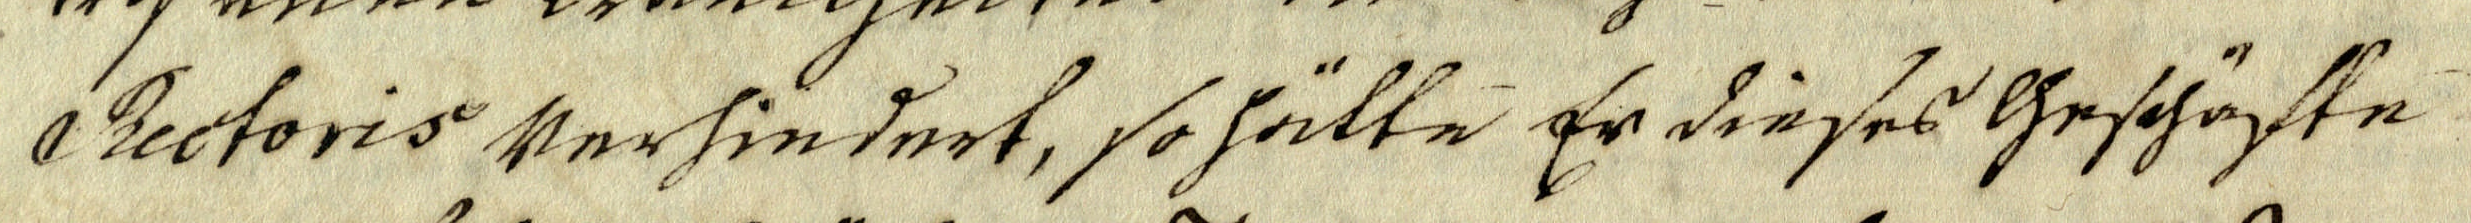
Rectoris verhindert, so hätte Er dieses Geschäfte
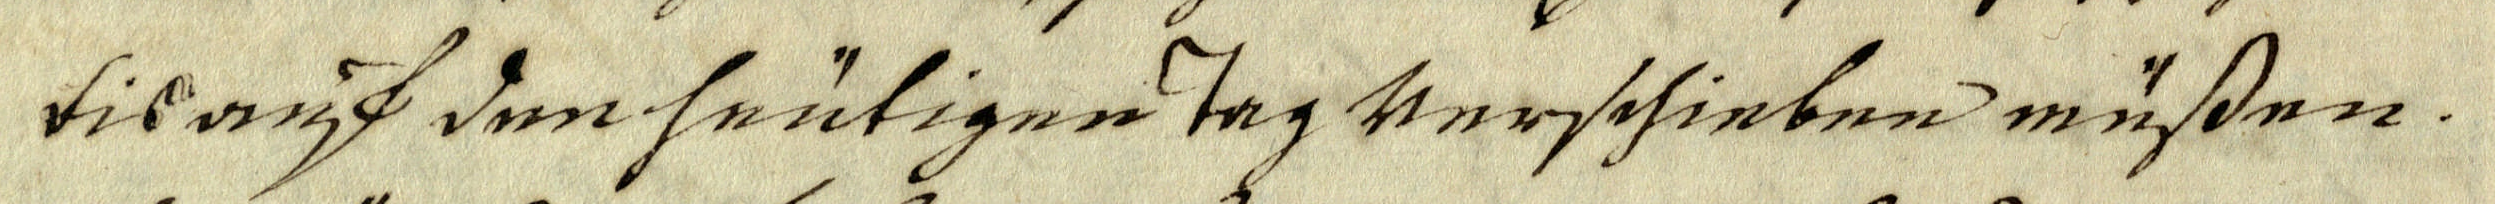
bis auf den heutigen Tag verschieben müßen.
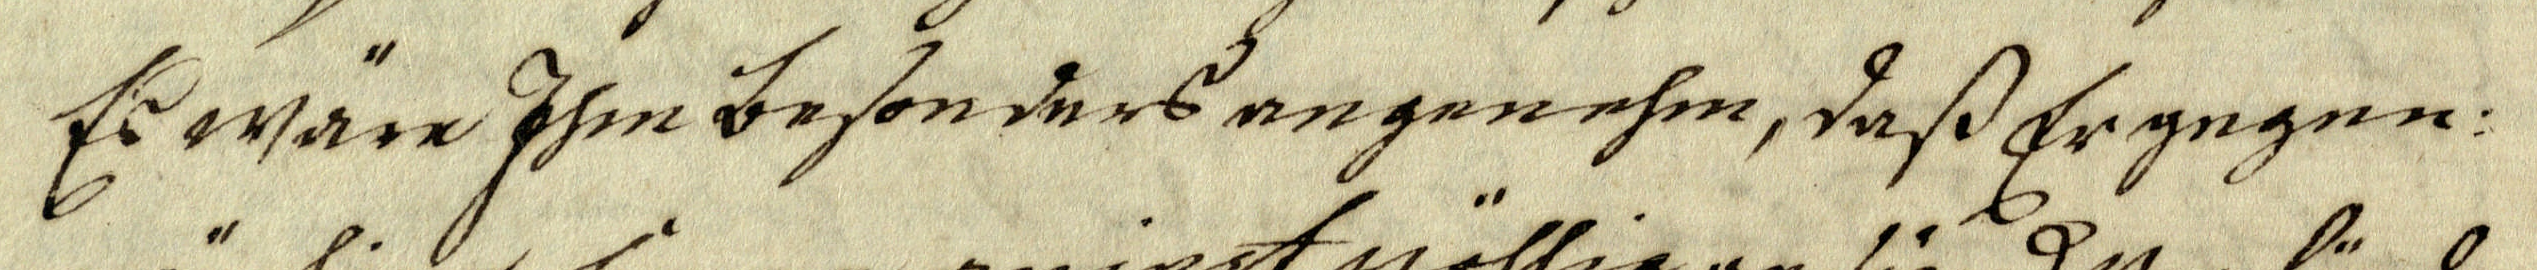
Es wäre Ihm besonders angenehm, daß Er gegen¬
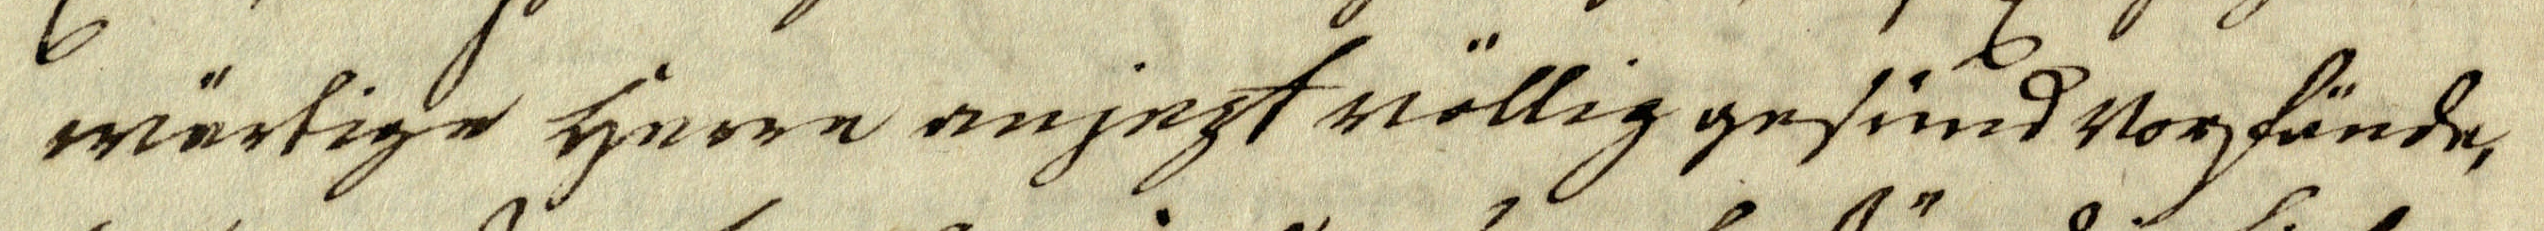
wärtige Herrn anjezt völlig gesund vorfände,
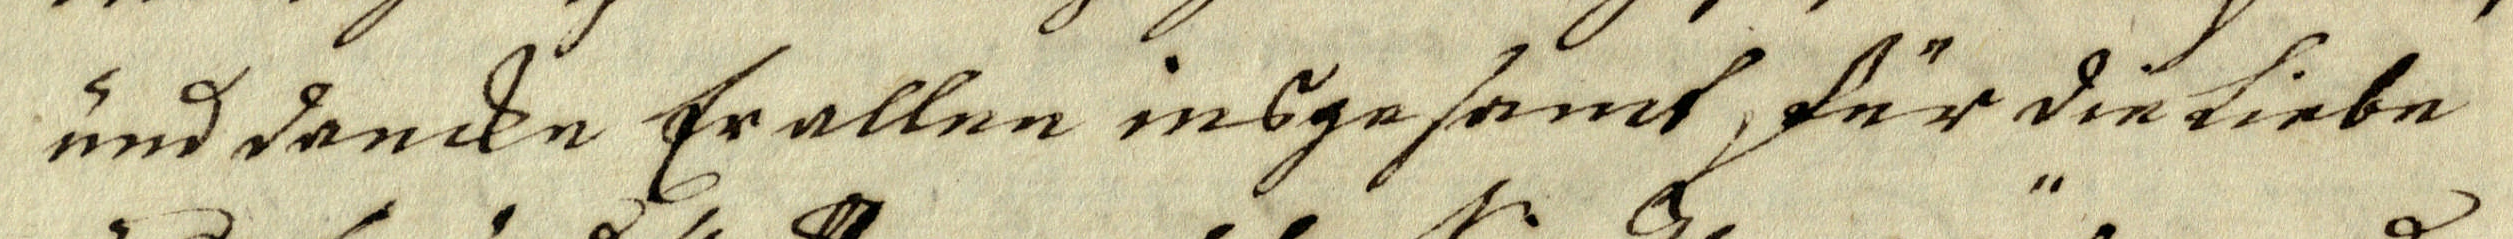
und dancke Er allen insgesamt, für die Liebe
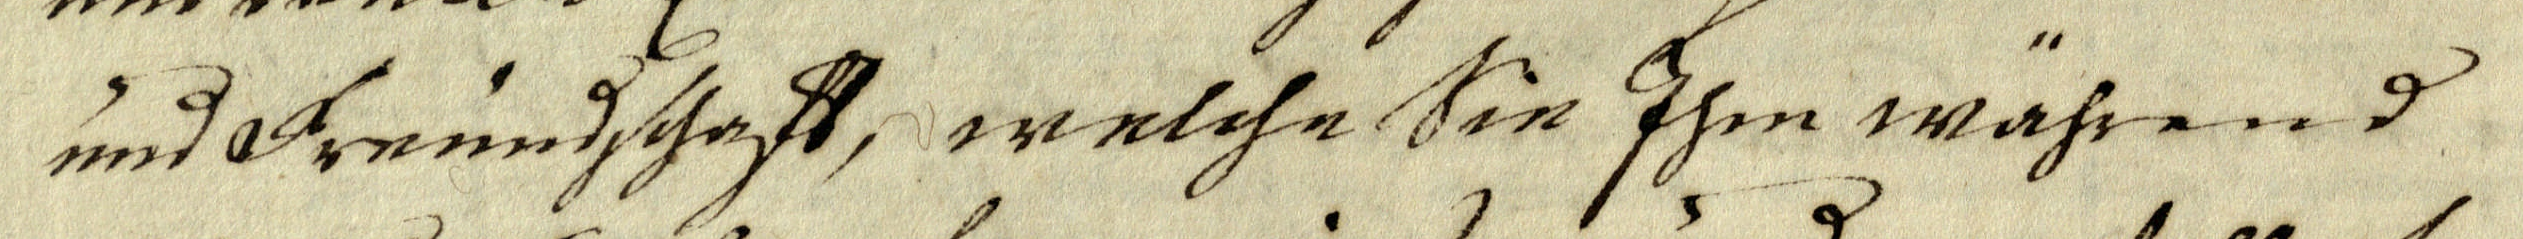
und Freundschaft, welche Sie Ihm während
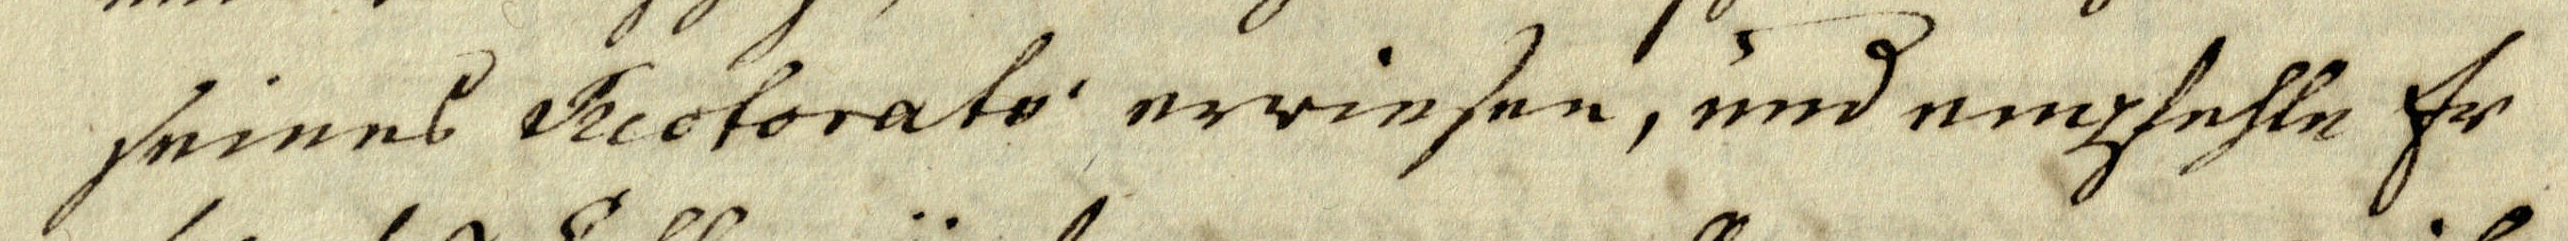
seines Rectorats erwiesen, und empfehle Er
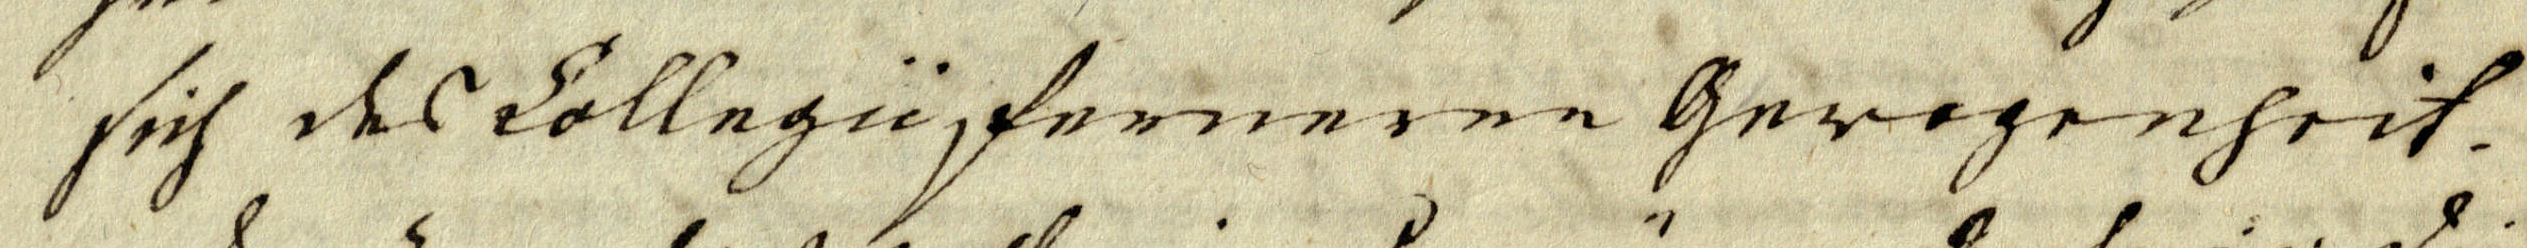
sich des Collegii ferneren Gewogenheit.
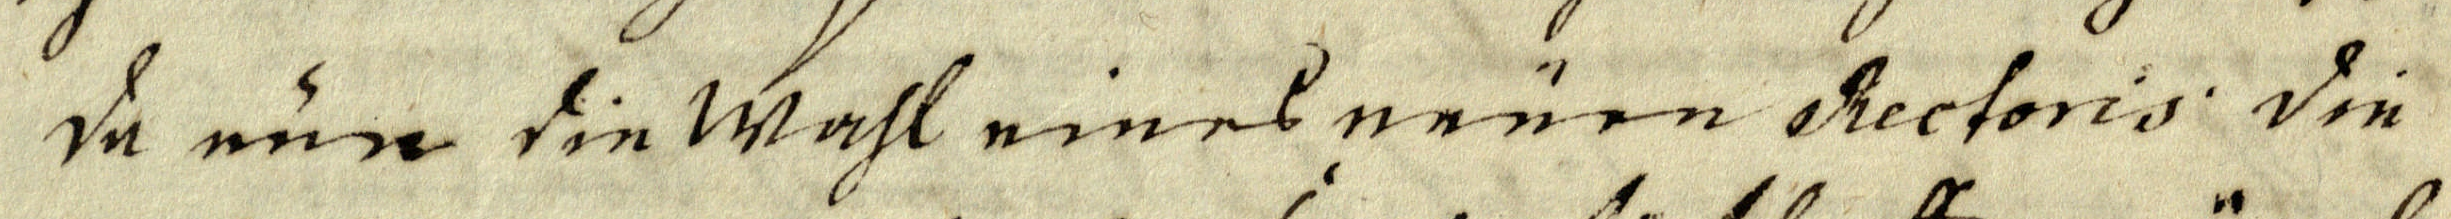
Da nun die Wahl eines neuen Rectoris die
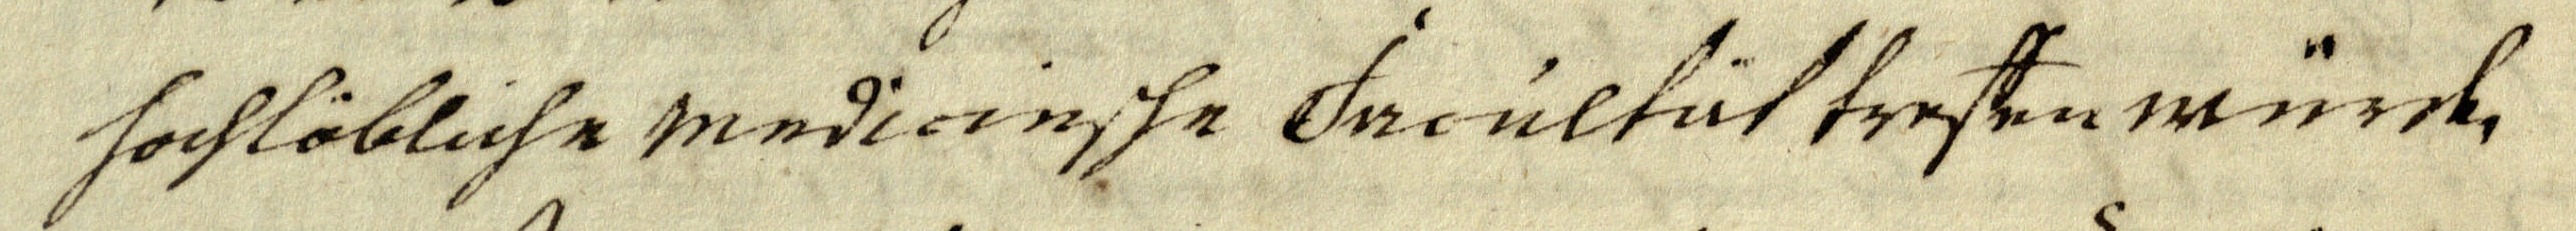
hochlöbliche Medicinische Facultät treffen würde,
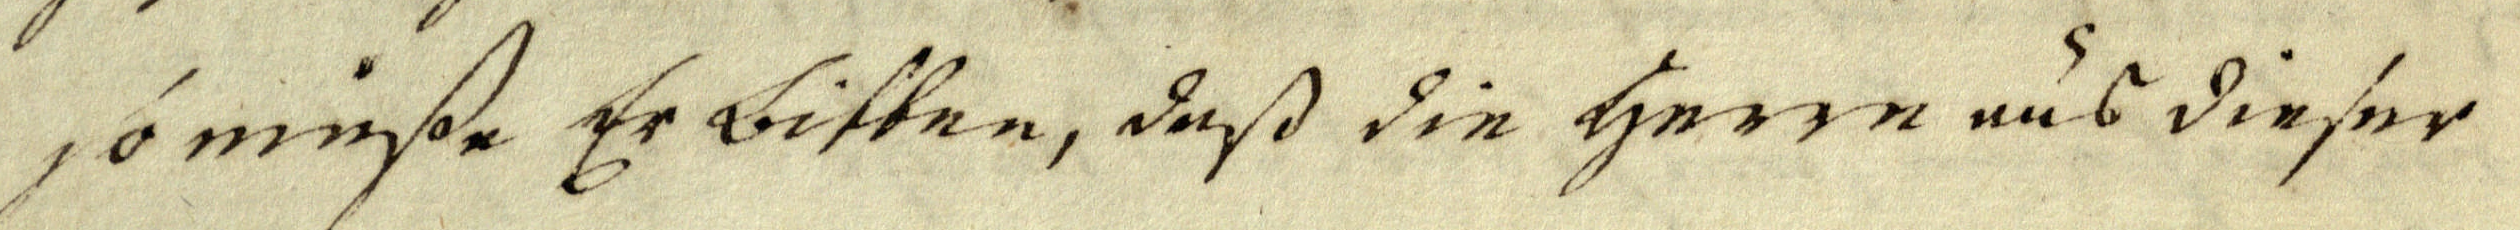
so müße Er bitten, daß die Herren aus dieser
